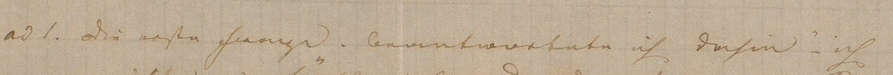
ad 1. Die erste Frage beantwortete ich dahin «ich
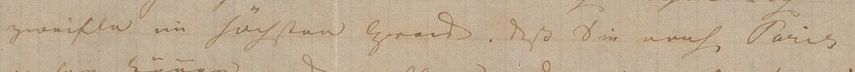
zweifle im höchsten Grad – daß Sie nach Paris
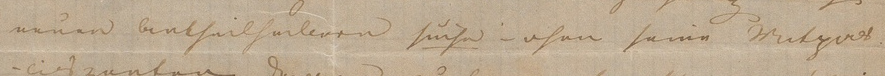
neuen Antheilhabern suche – ohne seine Mitpas-
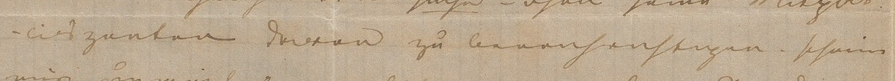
ciszenten davon zu benachrichtigen – schien
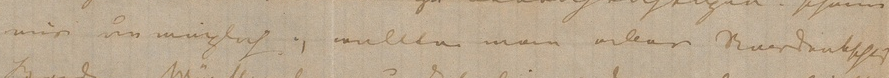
mir unmöglich; wollte man aber Nordeutschld
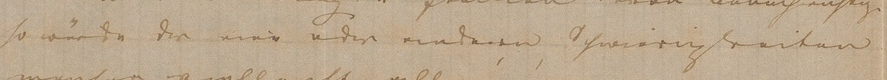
so würde der eine oder andere Schwierigkeiten
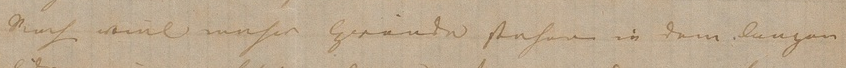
«Noch viel mehr Gründe stehen in dem langen
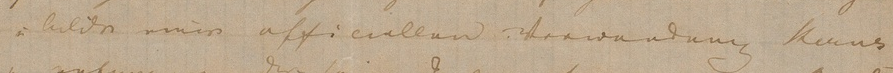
Bilde einer officiellen Verwendung Kerns
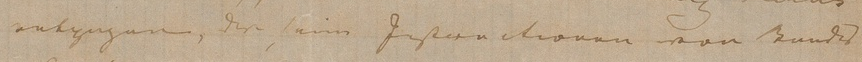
entgegen, der seine Instructionen von Bundes-
